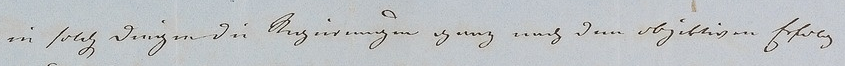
in solchen Dingen die Regierungen ganz nach dem objektiven Erfolg
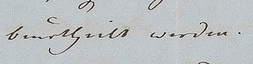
beurtheilt werden. —
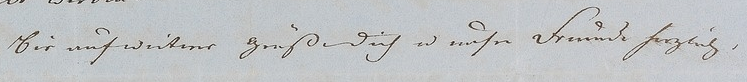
Bis auf weiteres grüße dich u unsre Freunde herzlich.
